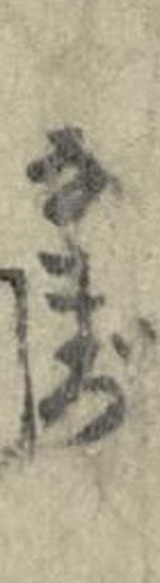なまづ
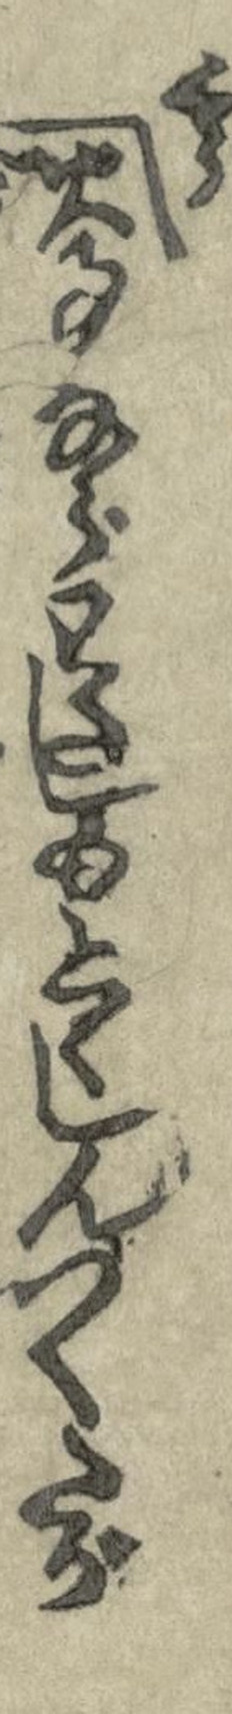〽火事ならわたしもとくしんつくたが
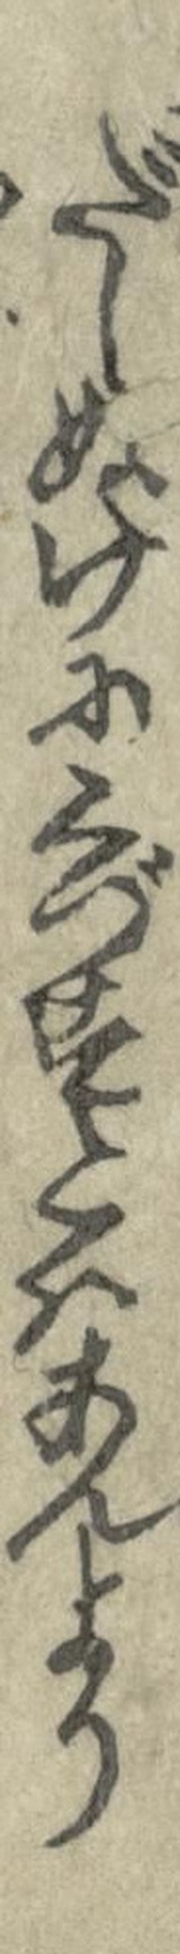だしぬけにくづすとはあんまり
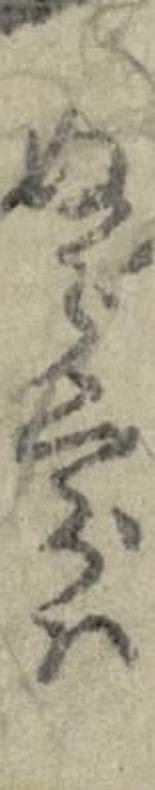ぬらくらは
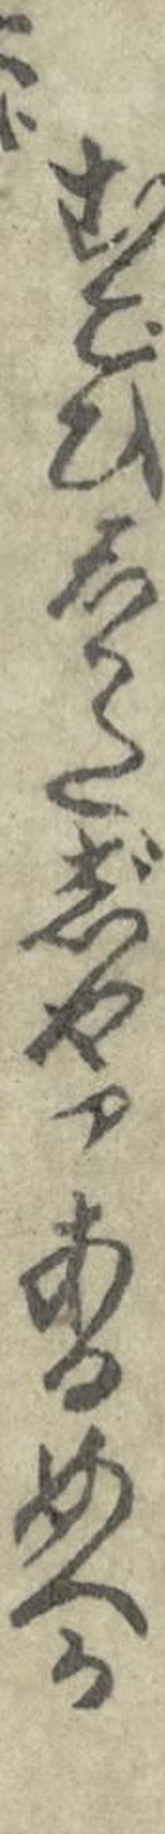むごひしかたじやぁあるめへか
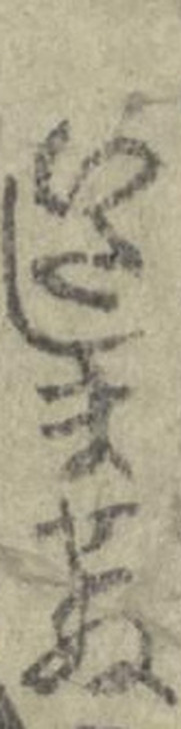いたしませぬ
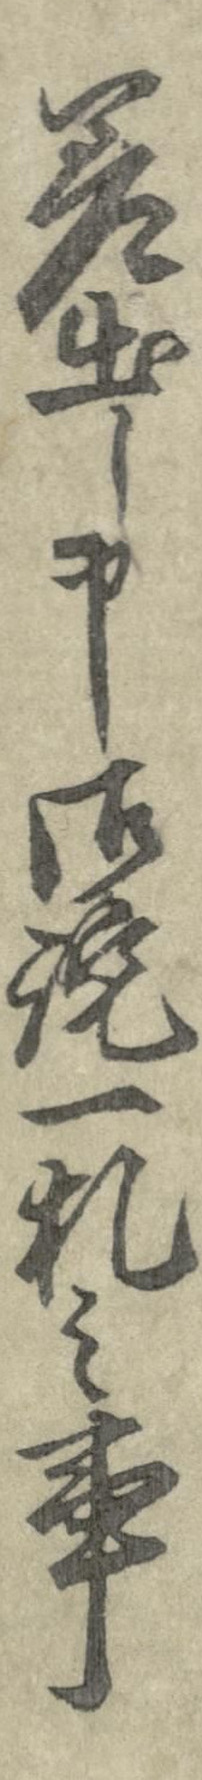差出し申御詫一札の事
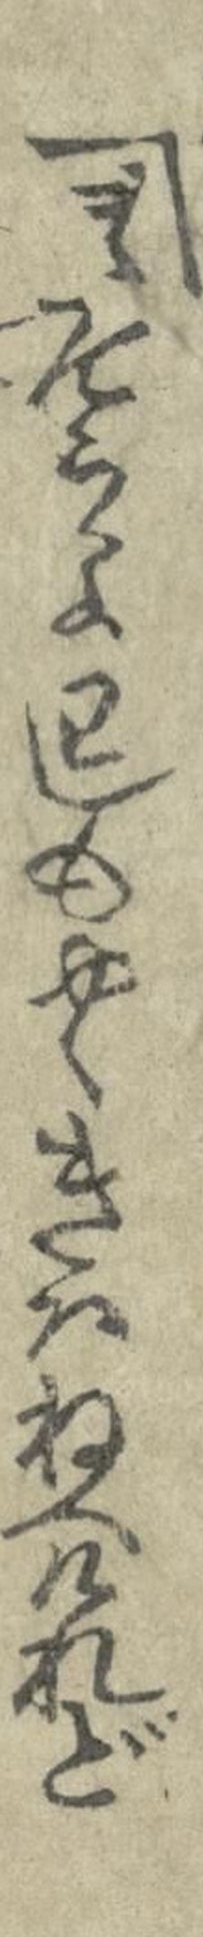〽をゝそうよわしもやくきはねへけれど
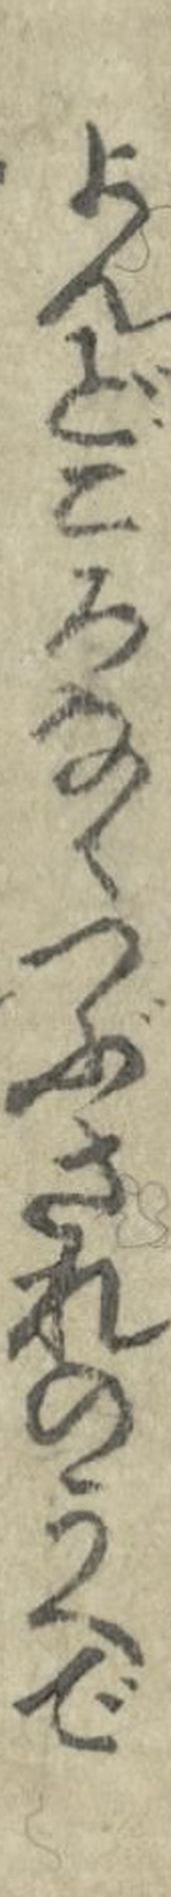よんどころなくつふされのうへで
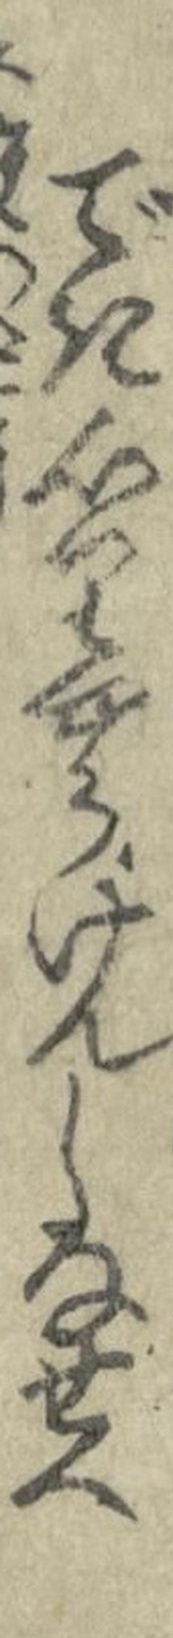でき心りやうけんしねせへ
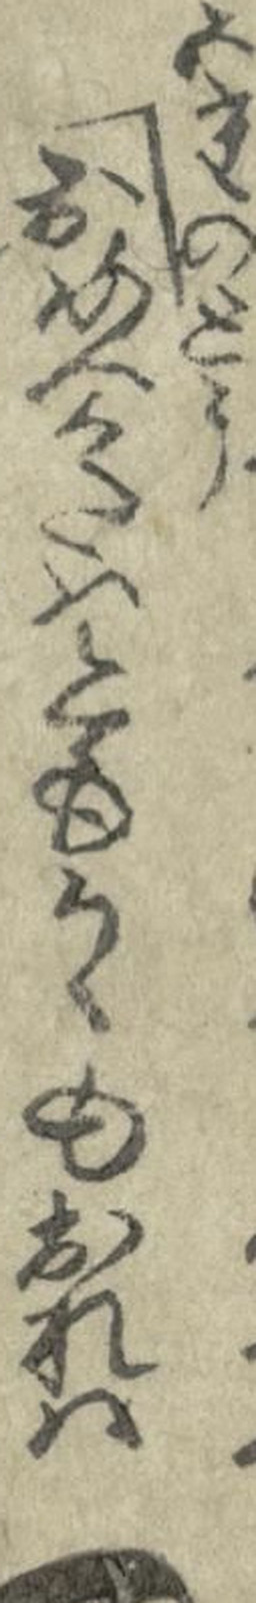〽おめへかたはともかくもおれは
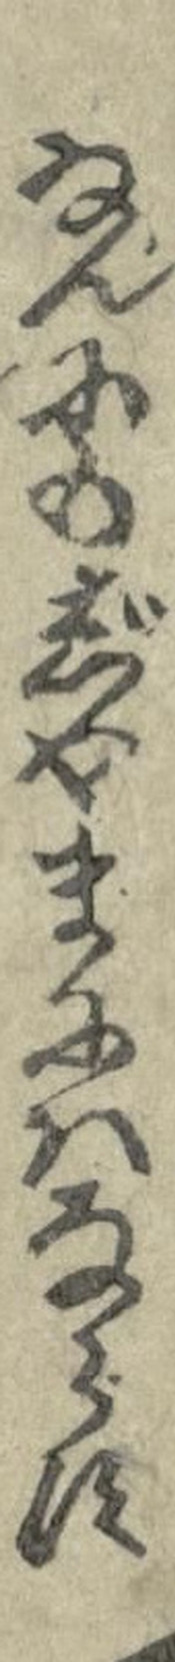なんにもじやまにはならす
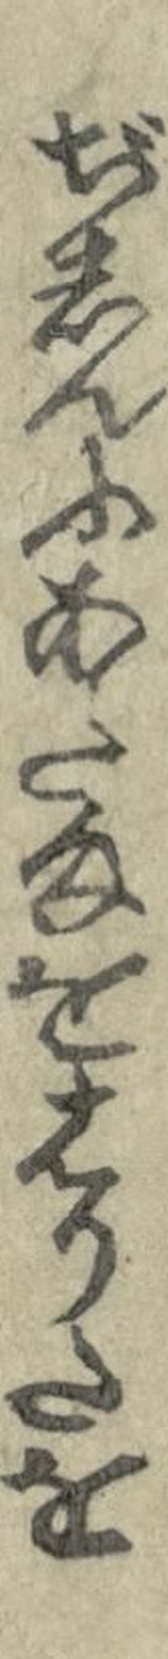じしんにあたまをはりたを
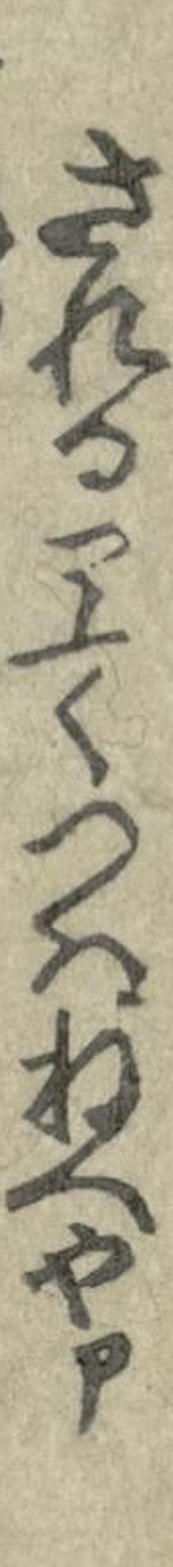されるりくつはねへやぁ
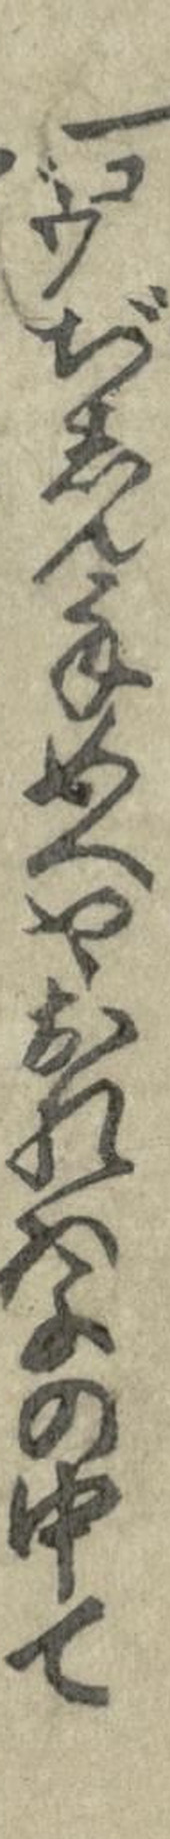〽こうぢしん手めへやおれはよの中て
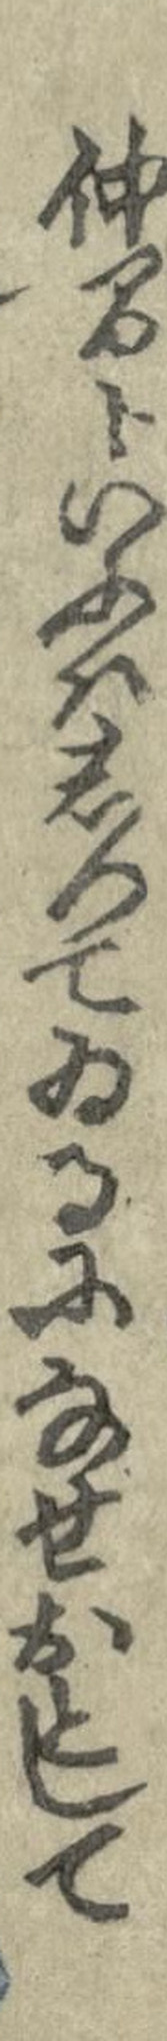仲間といふはしつてゐるになせおとして
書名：差出し申御詫一札之事
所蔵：東京大学地震研究所図書室 Earthquake Research Institute Library, The University of Tokyo, JAPAN
